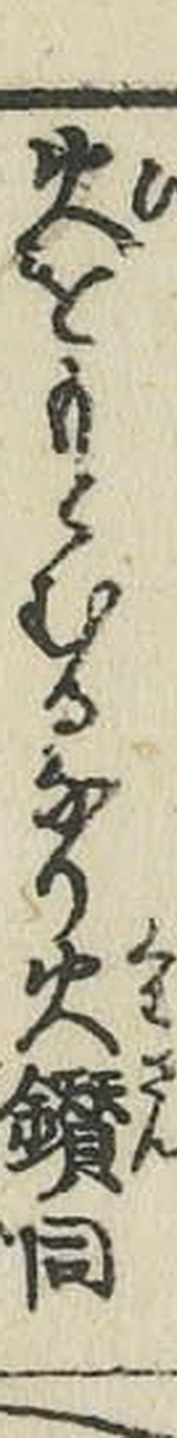火をもとむるなり火鑽同
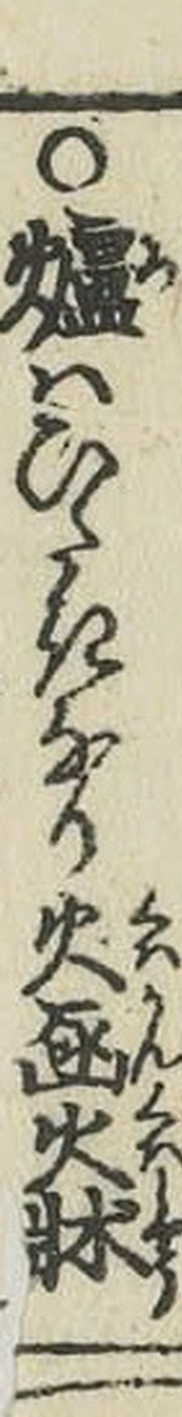○爐はひたきなり火函火牀
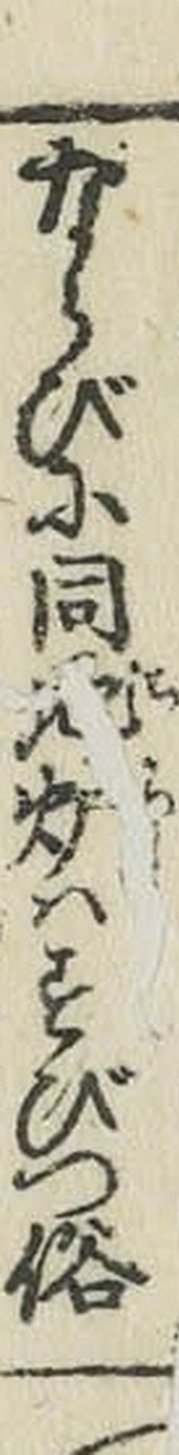ならびに同地炉はすびつ俗
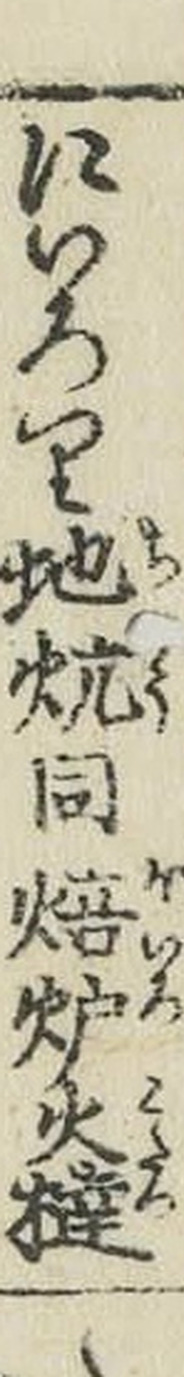にいろり地炕同焙炉火橽
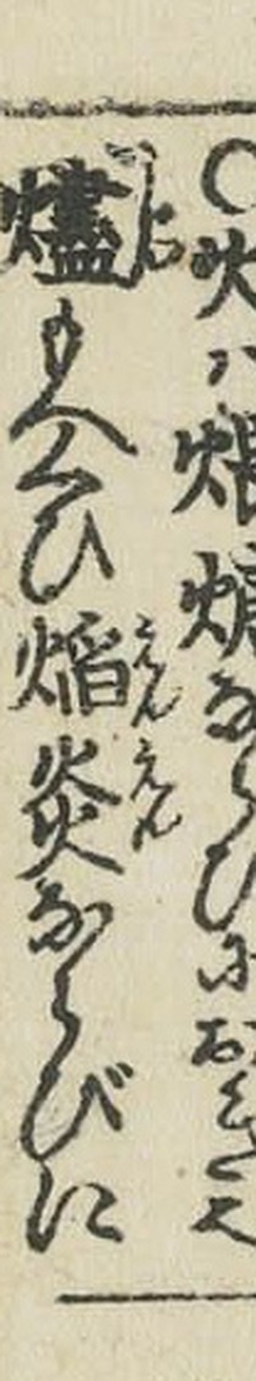燼もへくひ焔炎ならびに
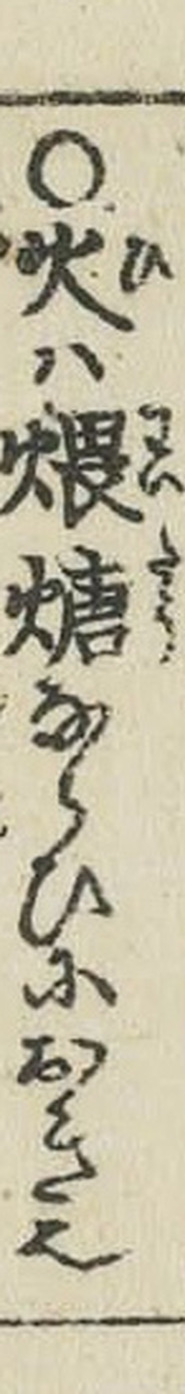○火は煨煻ならひにおき也
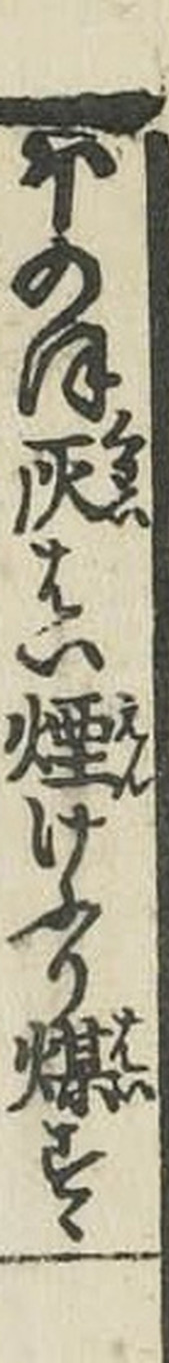ほのほ灰はい煙けふり煤すゝ
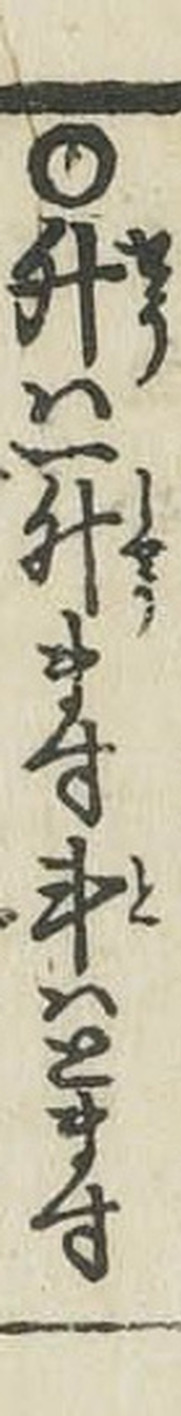○升は一升ます斗はとます
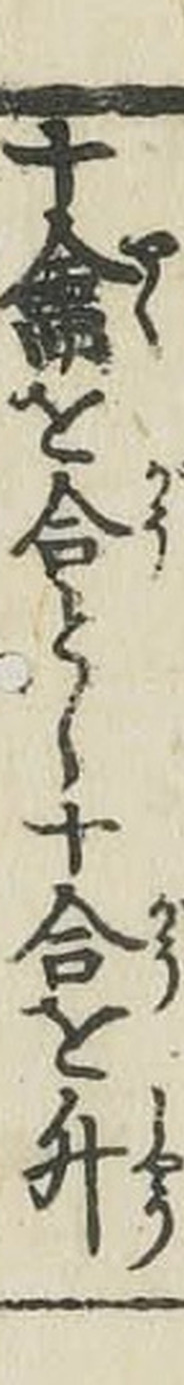十龠を合とし十合を升
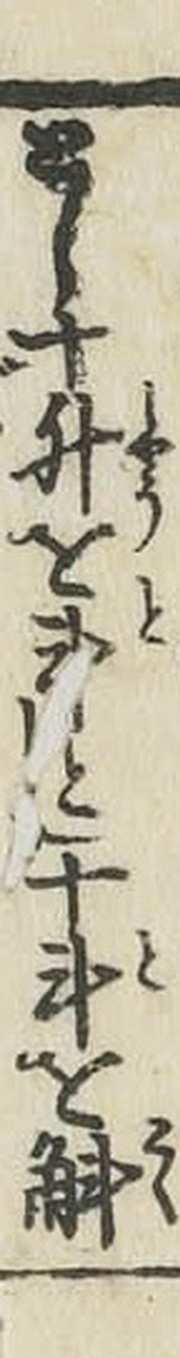とし十升を斗とし十斗を斛
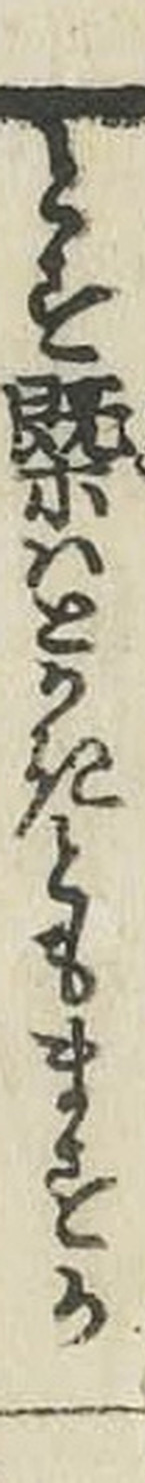とす槩はとかきともますか
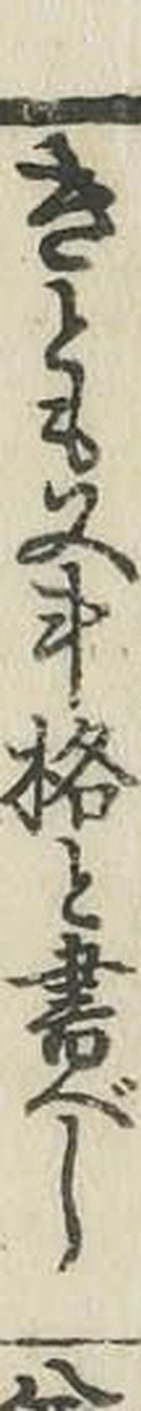きとも又斗格と書べし
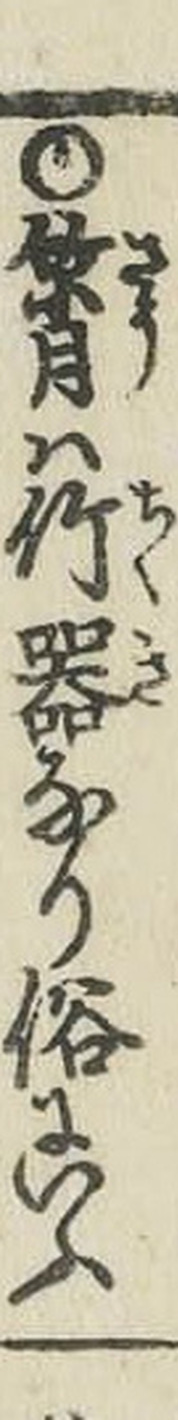○筲は竹器なり俗にいふ
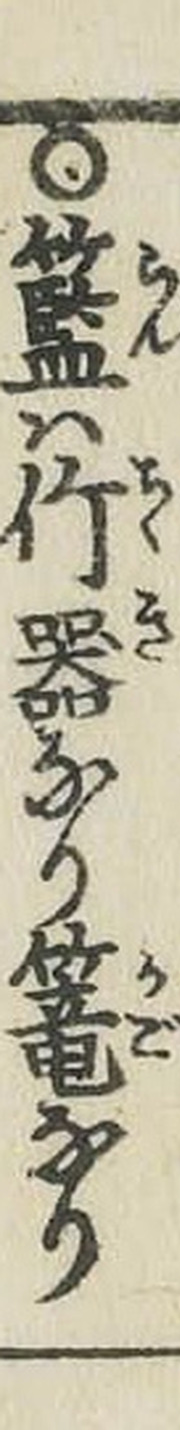○籃は竹器なり篭なり
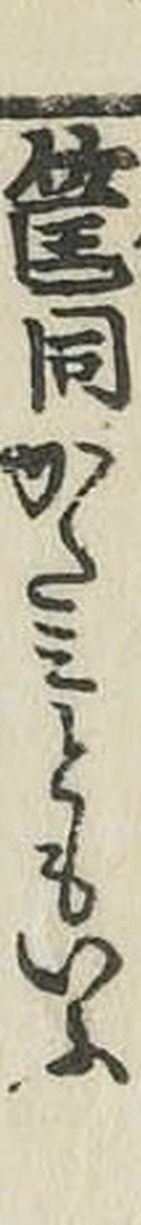筐同かたみともいふ
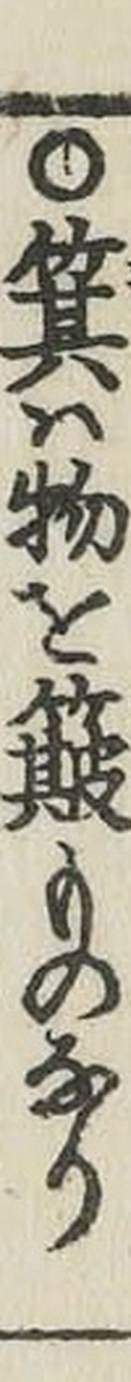○箕は物を簸ものなり
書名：増補頭書訓蒙図彙大成 10巻 5:巻之9-11
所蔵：東京学芸大学教育コンテンツアーカイブ
